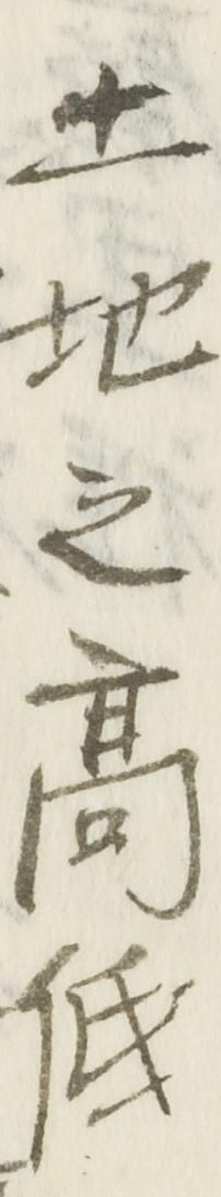土地之高低
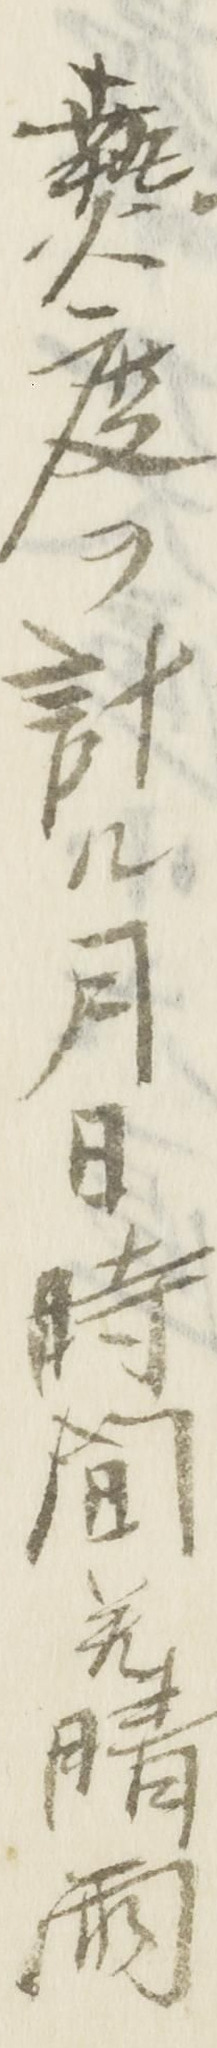熱度ヲ計ル月日時間并晴雨
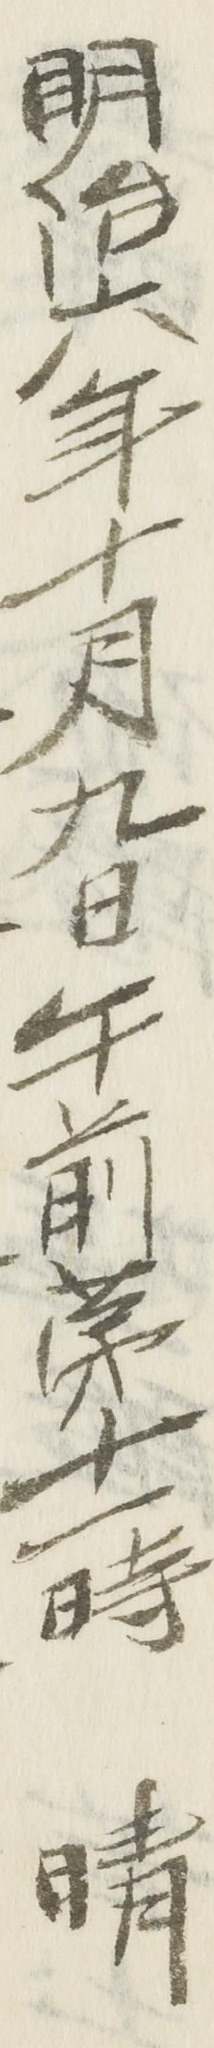明治六年十月九日午前第十一時晴
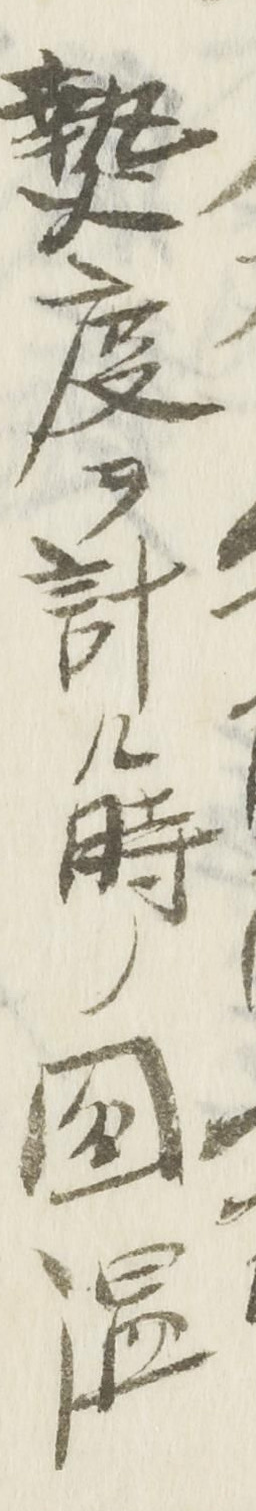熱度ヲ計ル時ノ分温
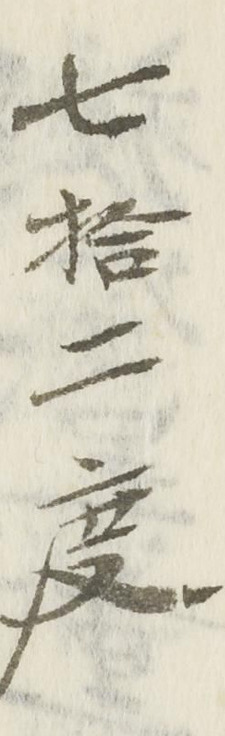七拾二度
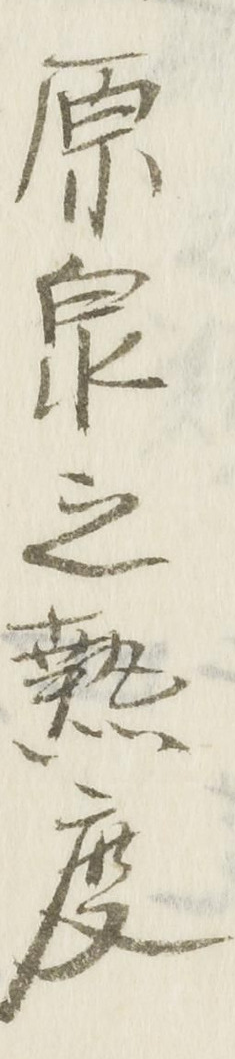原泉之熱度
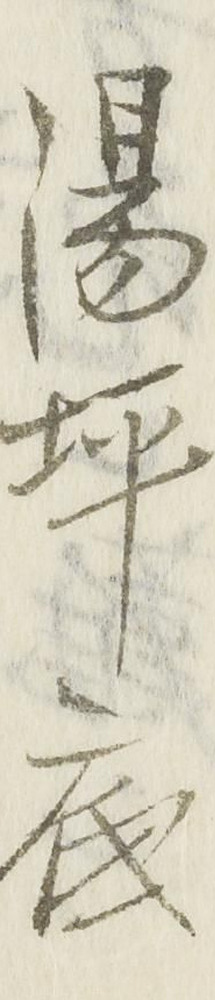湯坪底
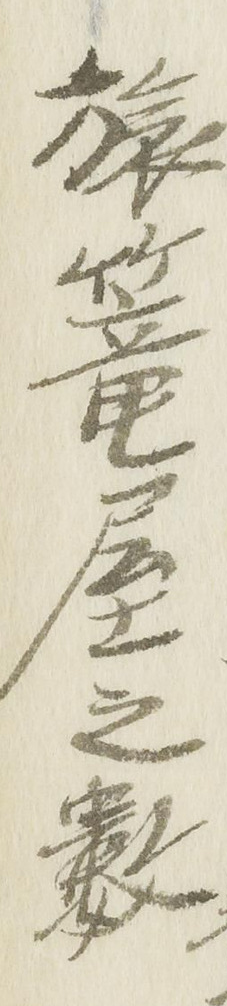旅籠屋之数

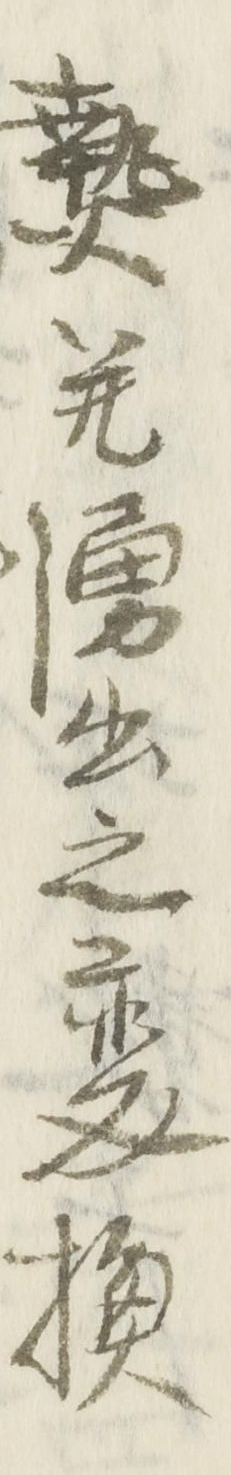熱并湧出之変換
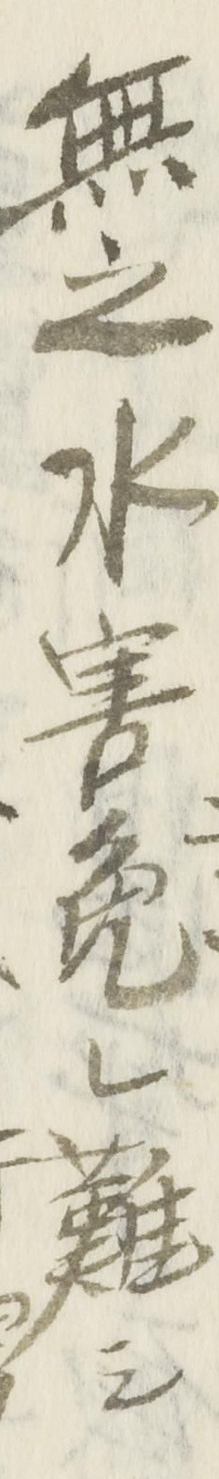無之水害免レ難シ
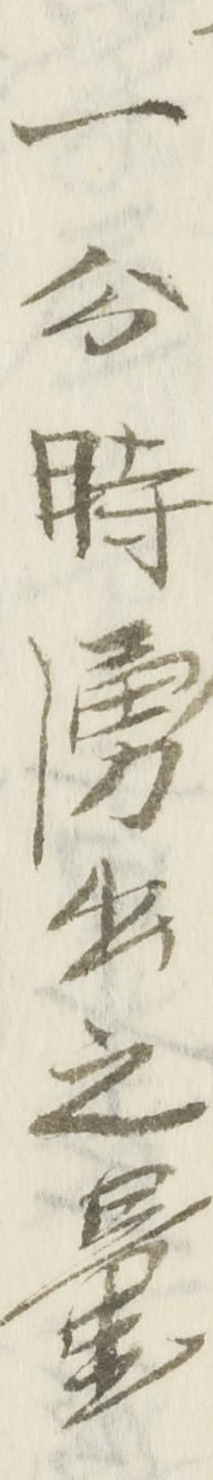一分時湧出之量
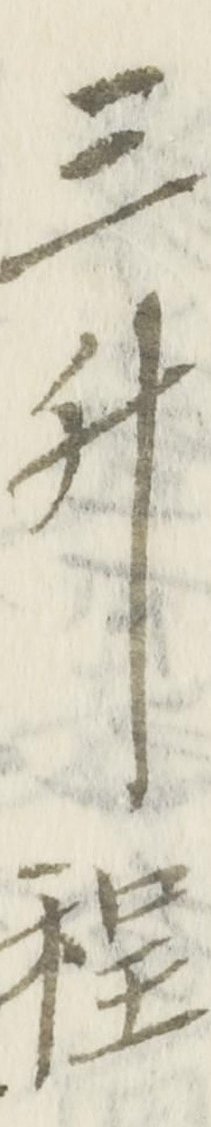三升程
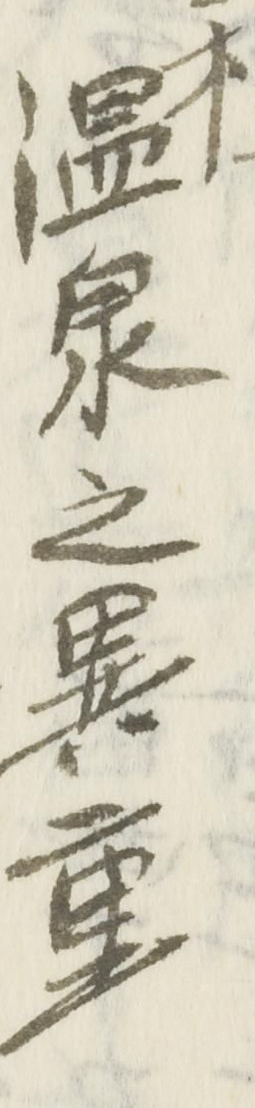温泉之異重
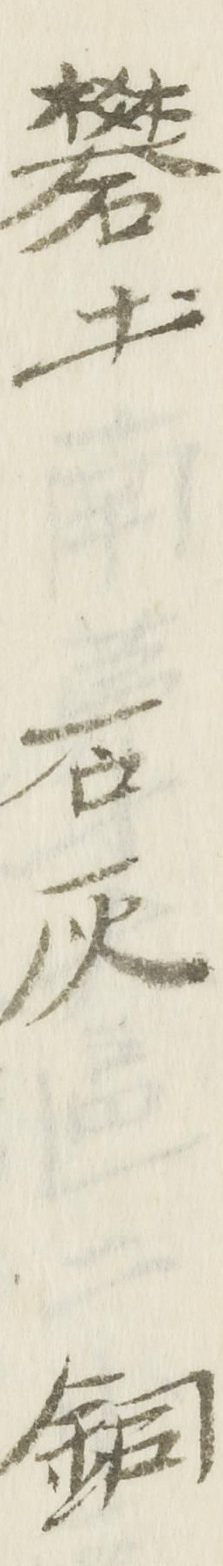礬土石灰銅
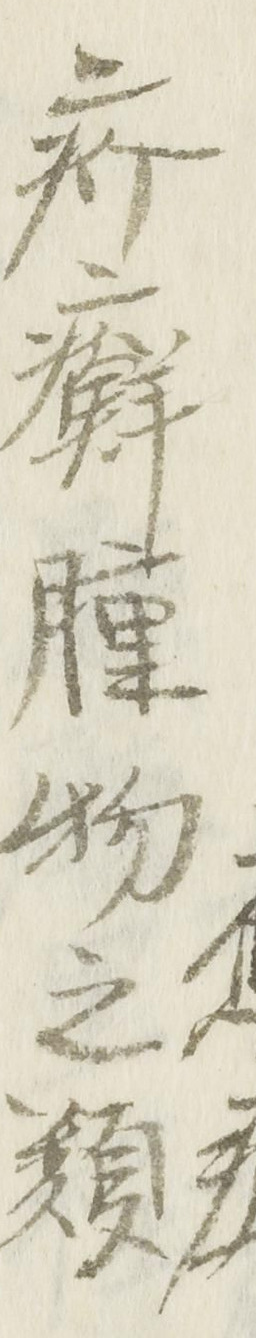疥癬腫物ノ類

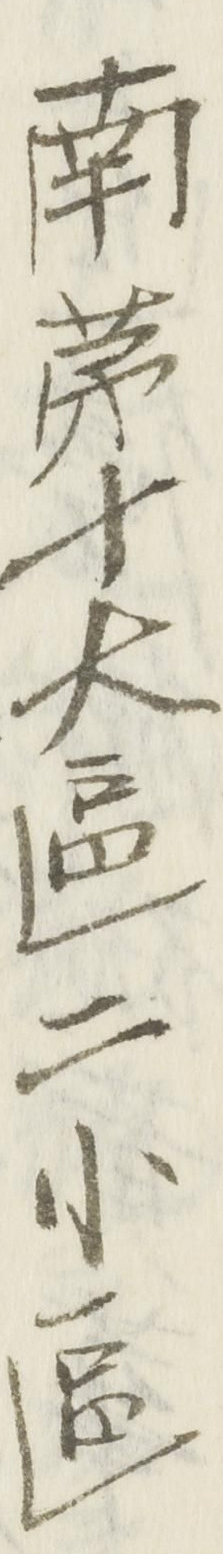南第一十区二小区
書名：温冷泉試験表
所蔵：東京大学地震研究所図書室 Earthquake Research Institute Library, The University of Tokyo, JAPAN
